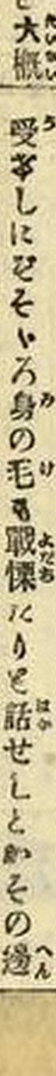受けしにぞそゞろ身の毛も戰慄たりと話せしとかその邊
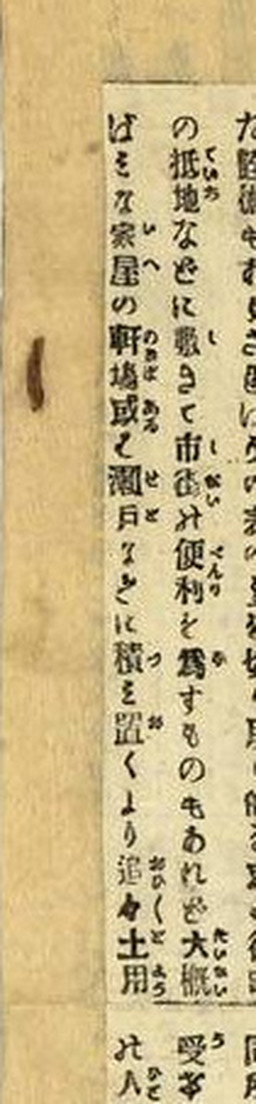はみな家屋の軒塲或は瀬戸などに積み置くより追々土用
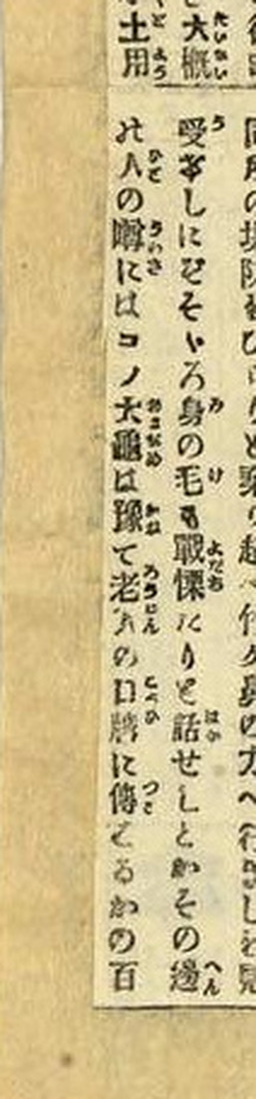の人の噂にはコノ大龜は豫て老人の口唇に傳はるかの百

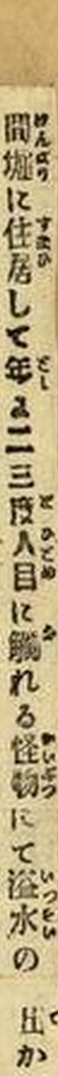間堀に住居して年に二三度人目に觸れる怪物にて溢水の
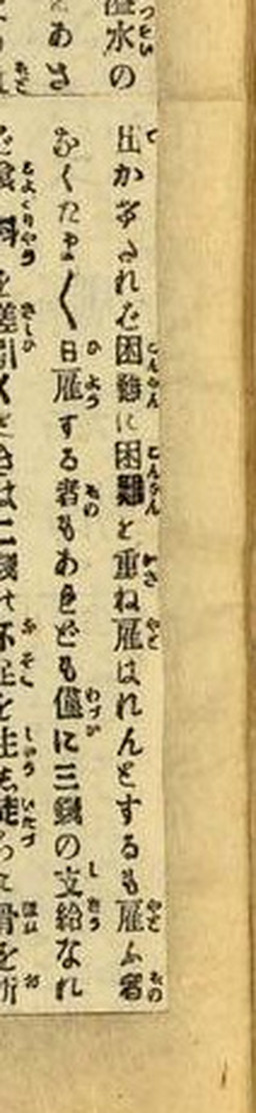出かけたれば困難に困難を重ね雇はれんとするも雇ふ者
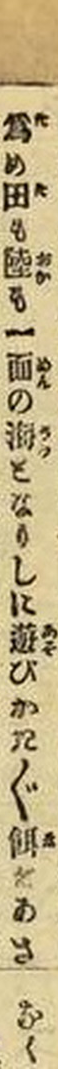爲め田も陸も一面の海となりしに遊びかた〴〵餌をあさ
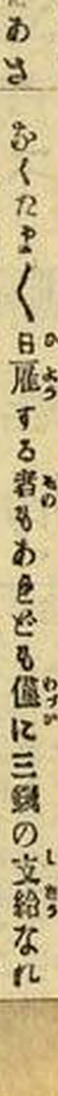なくたま〳〵日雇する者もあれども僅に三錢の支給なれ
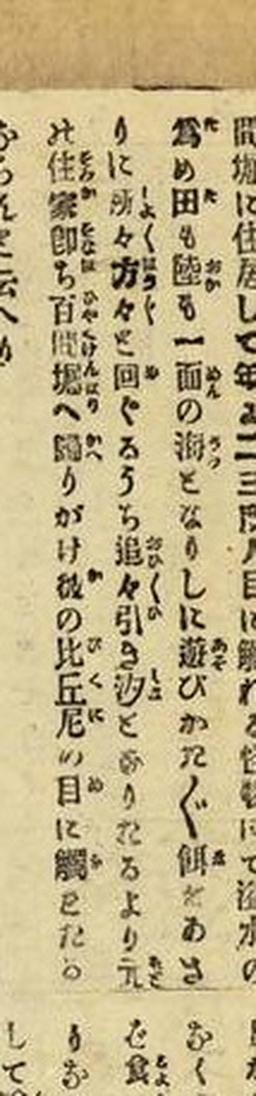りに所々方々と回ぐるうち追々引き汐となりたるより元
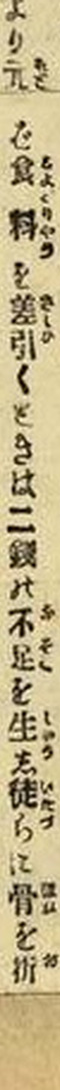ば食料を差引くときは二錢の不足を生し徒らに骨を折
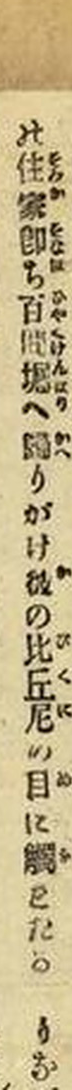の住家卽ち百間堀へ歸りがけ彼の比丘尼の目に觸れたる
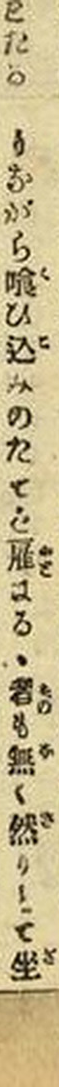りながら喰ひ込みのたてば雇はるゝ者も無く然りとて坐
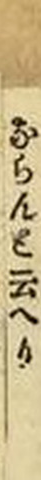ならんと云へり
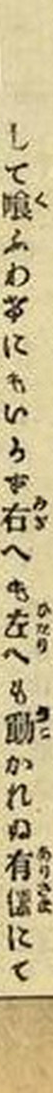して喰ふわけにもいかず右へも左へも動かれぬ有様にて
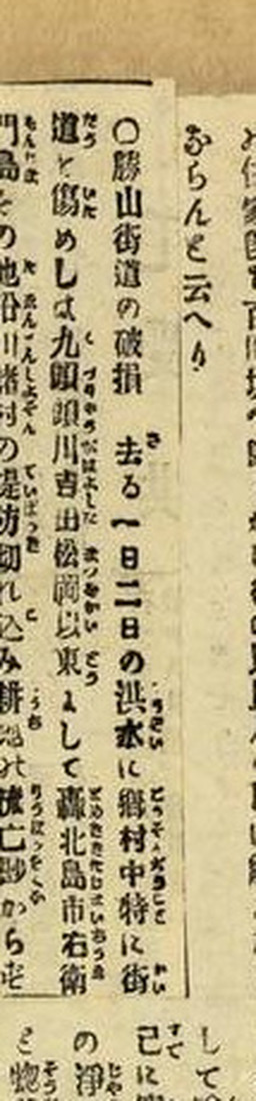○勝山街道の破損去る一日二日の洪水に郷村中特に街
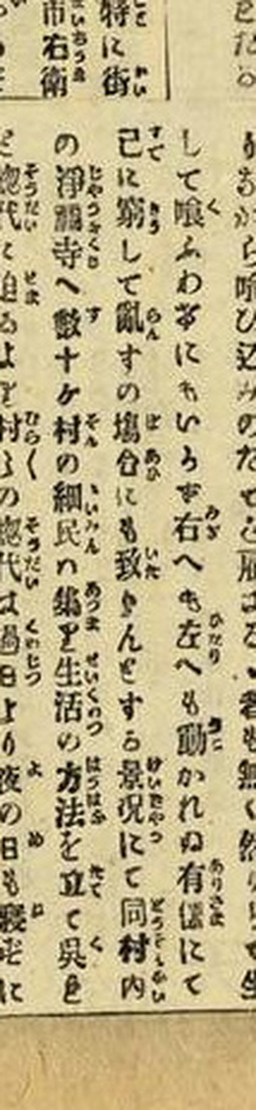已に窮して亂すの塲合にも致らんとする景况にて同村内
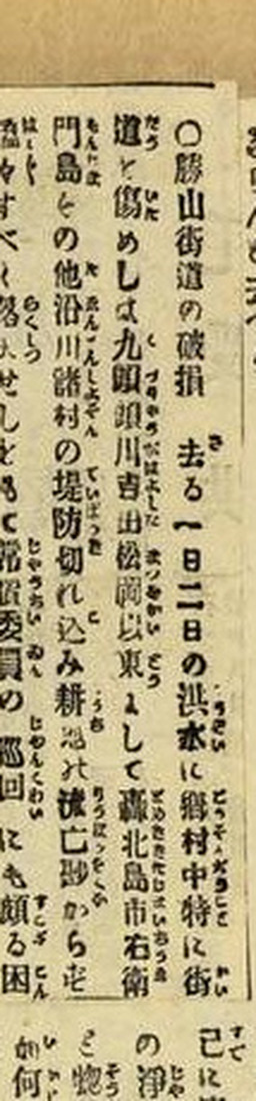道を傷めしは九頭龍川吉田松岡以東にして轟北島市右衛
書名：温古集 五巻
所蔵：福井県文書館 Fukui Prefectural Archives
